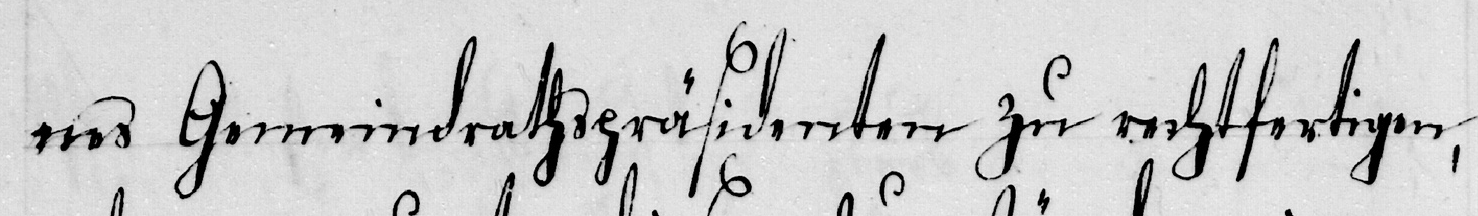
nes Gemeindrathspräsidenten zu rechtfertigen,
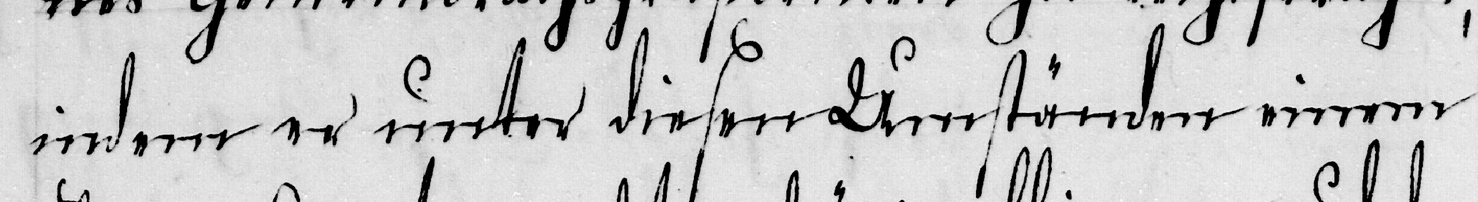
indem er unter diesen Umständen einem
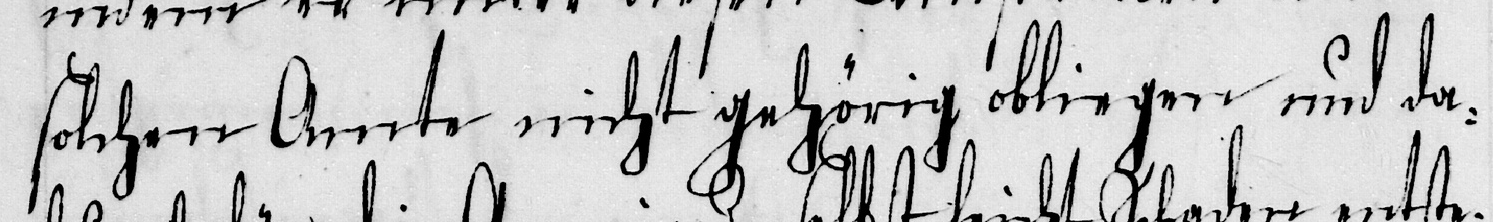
solchen Amte nicht gehörig obliegen und da¬
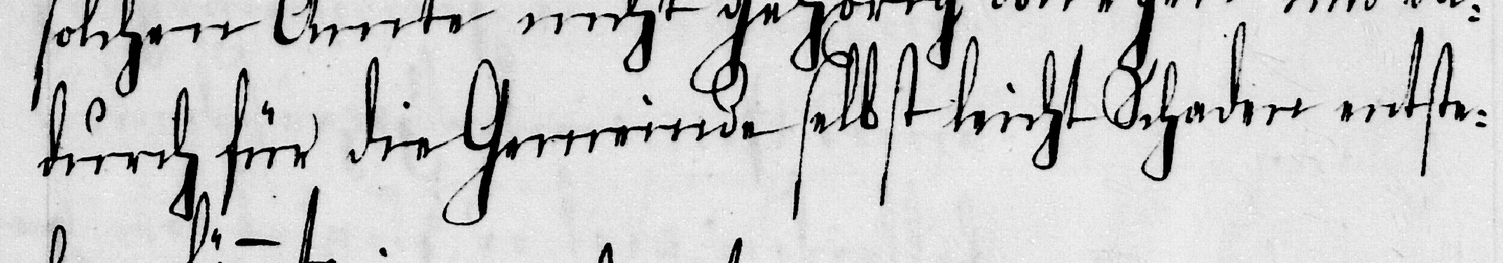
durch für die Gemeinde selbst leicht Schaden entst¬
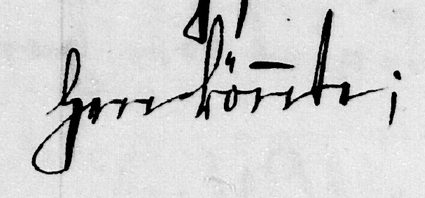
ehen könnte;
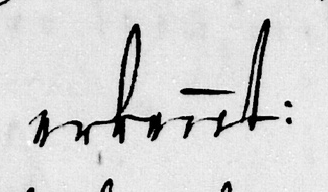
erkannt:
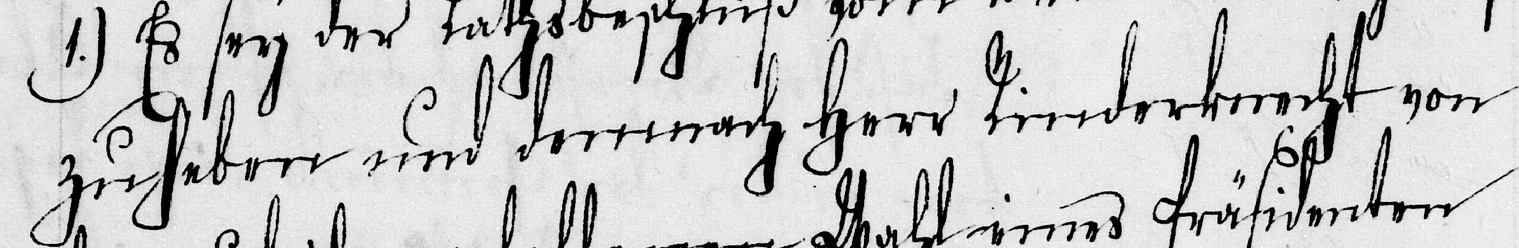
zuheben und demnach Herr Rinderknecht von
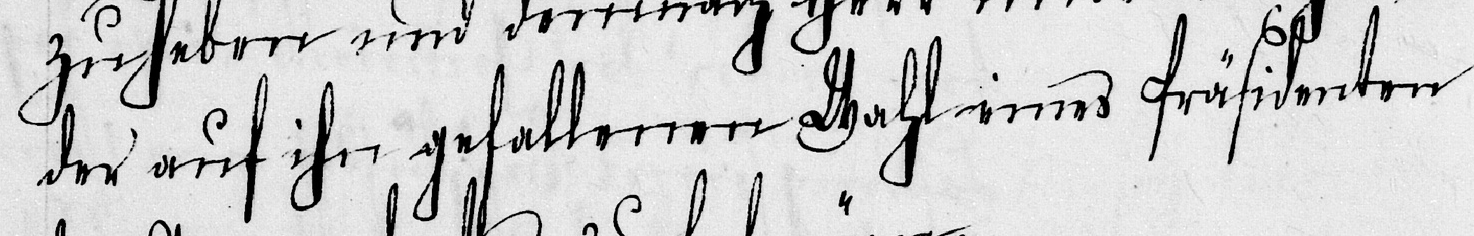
der auf ihn gefallenen Wahl eines Präsidenten
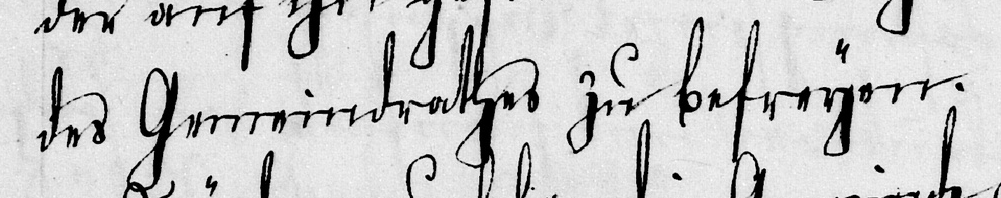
des Gemeindrathes zu befreyen.
